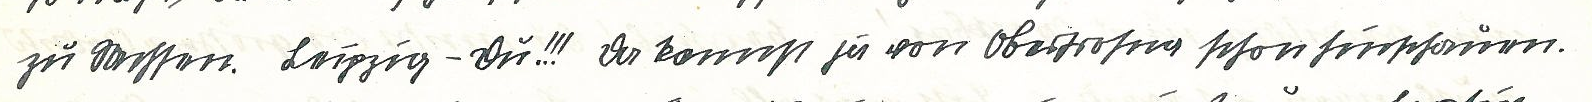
zu Sachsen. Leipzig – Du!!! Da kannst ja von O. schon hinschauen.
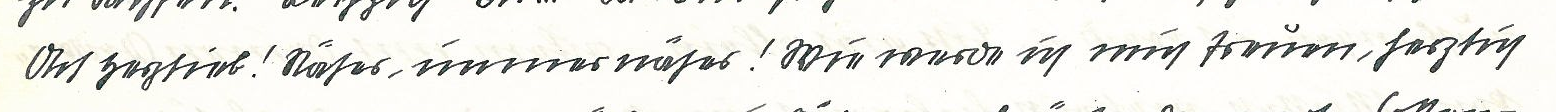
Ach Herzlieb! Näher, immer näher! Wie werde ich mich freuen, herzlich
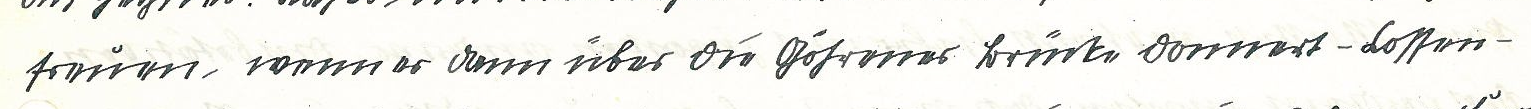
freuen, wenn es dann über die G.er Brücke donnert – L.–
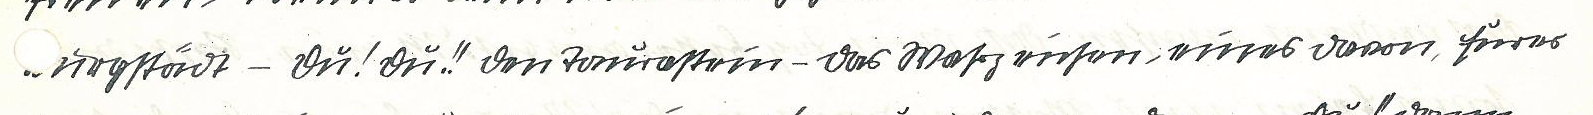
– Du! Du!! Den T. – das Wahrzeichen, eines davon, Eurer
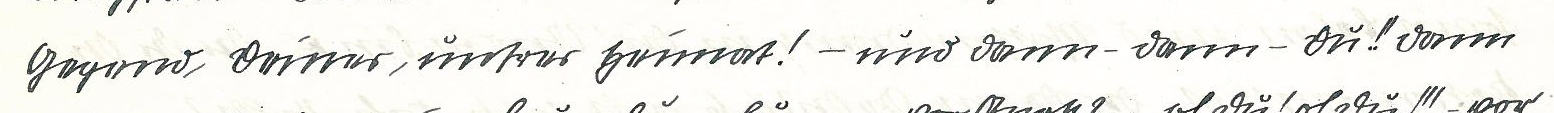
Gegend, Deiner, unsrer Heimat! – und dann – dann – Du!! dann
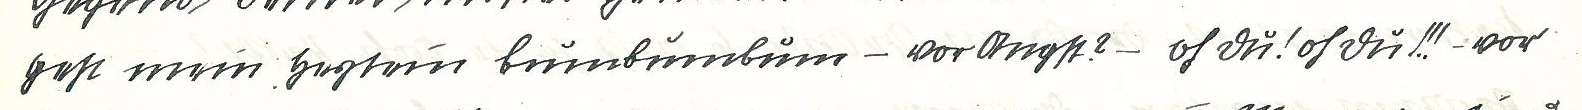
geht mein Herzlein bumbumbum – vor Angst? – oh, Du! oh Du!!! – vor
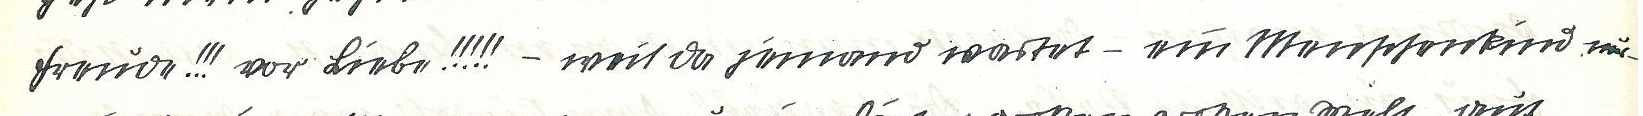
Freude!!! vor Liebe!!!!! – weil da jemand wartet – ein Menschenkind nur –
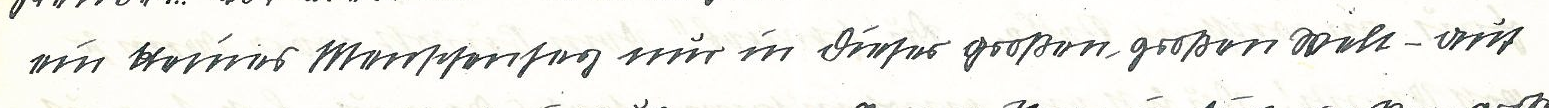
ein kleines Menschenherz nur in dieser großen, großen Welt – auf
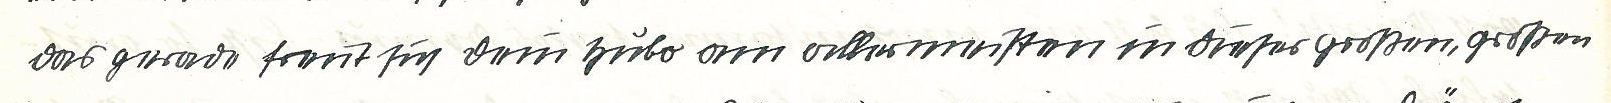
das gerade freut sich Dein am allermeisten in dieser großen, großen
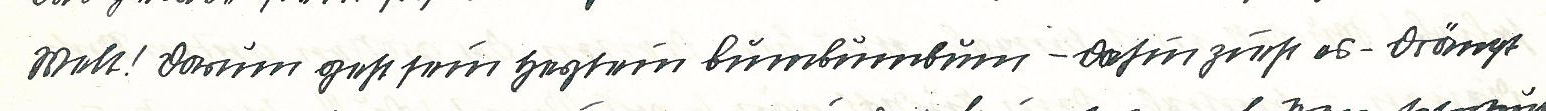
Welt! Darum geht sein Herzlein bumbumbum – dahin zieht es – drängt
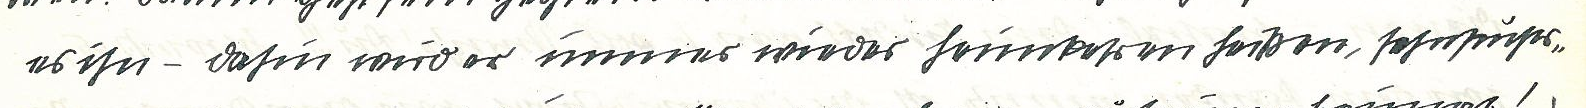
es ihn – dahin wird es immer wieder heimkehren heißen, sehnsuchts¬
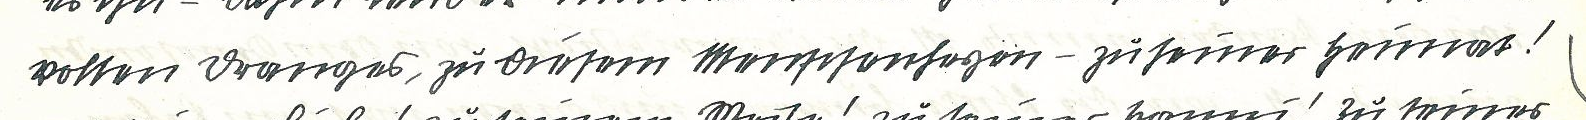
vollen Dranges, zu diesem Menschenherzen – zu seiner Heimat!
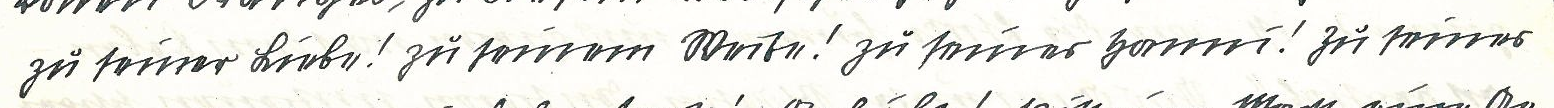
zu seiner Liebe! zu seinem Weibe! zu seiner! zu seiner
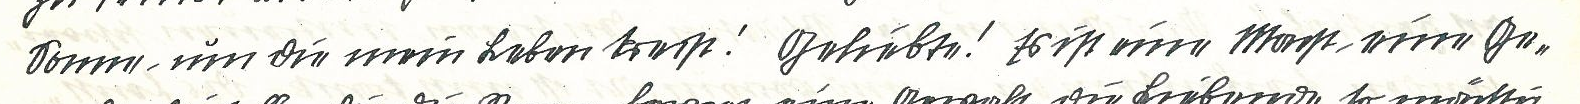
Sonne, um die mein Leben kreist! Geliebte! Es ist eine Macht, eine Ge¬
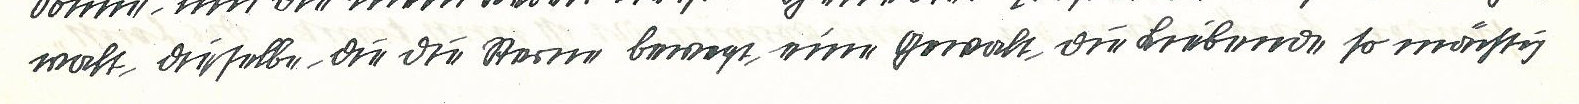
walt, dieselbe, die die Sterne bewegt, eine Gewalt, die Liebende so mächtig
